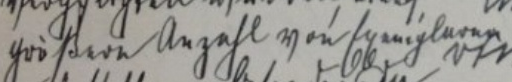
größere Anzahl von Exemplaren
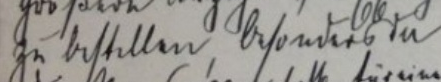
zu bestellen, besonders da
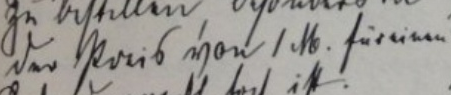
der Preis von 1 M für einen
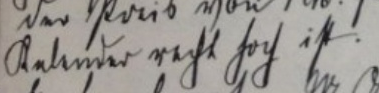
Kalender sehr hoch ist.
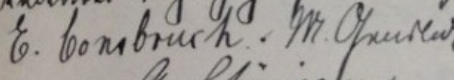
E. Consbruch M. Gansland
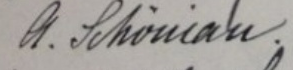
A. Schönian
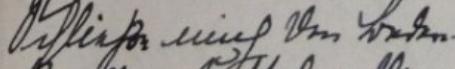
Schließe mich den Beden
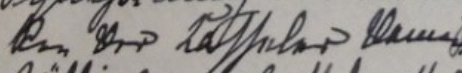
ken der Kasseler Damen
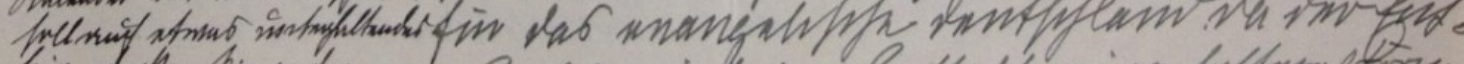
soll auf
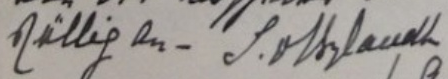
völlig an -
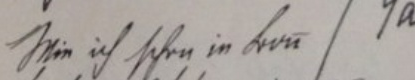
Wie ich schon in
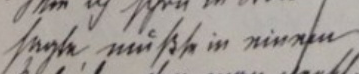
sagte müßte in einem
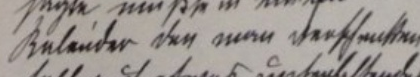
Kalender den man verschenken
